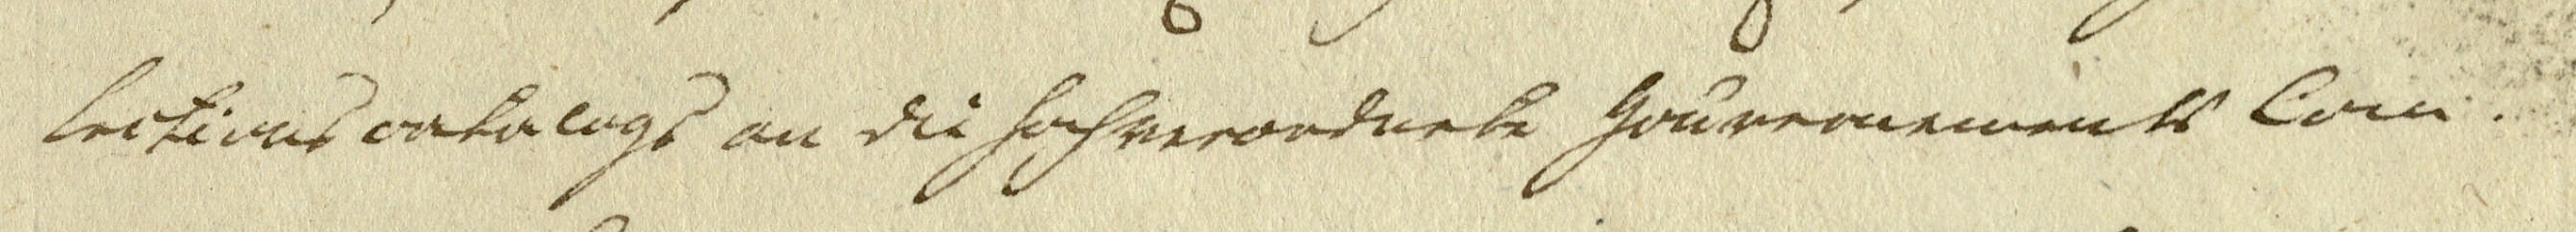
Lectionscatalogs an die Hochverordnete Gouvernements Com¬
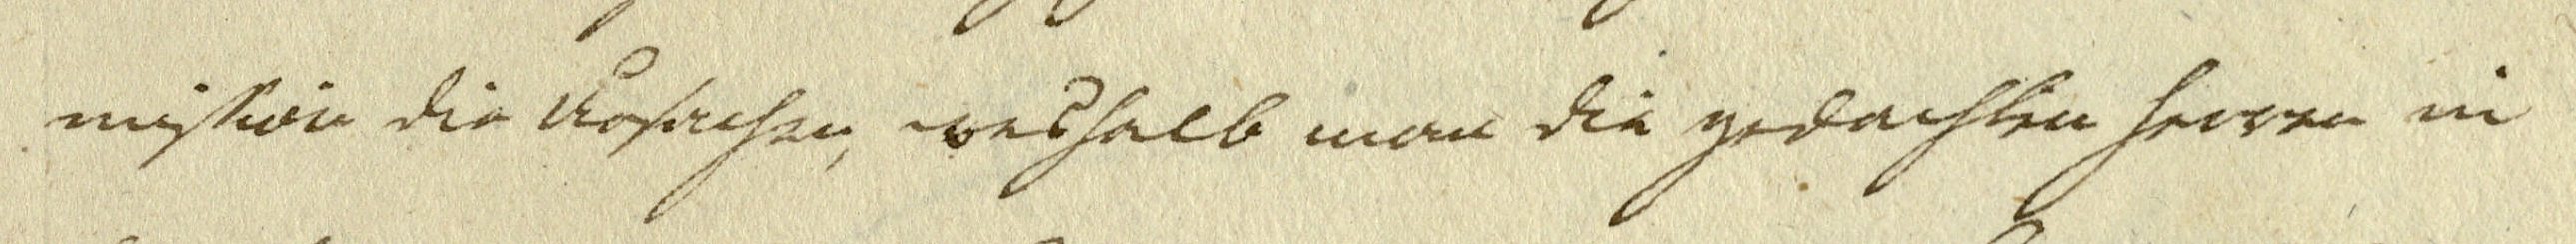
mission die Ursachen, weshalb man die gedachten Herren in
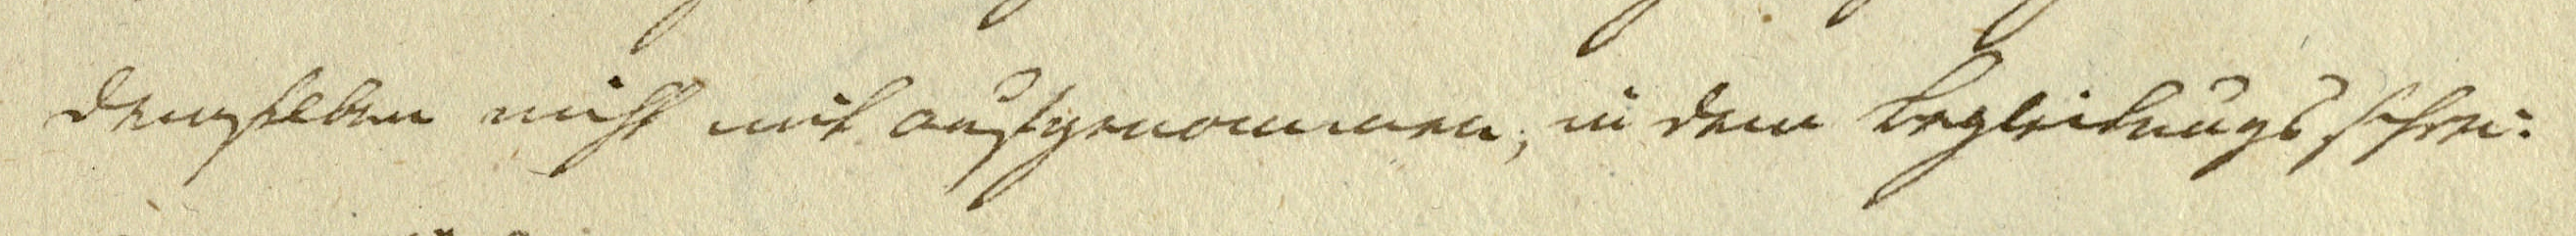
demselben nicht mit aufgenommen, in dem Begleitungsschrei¬
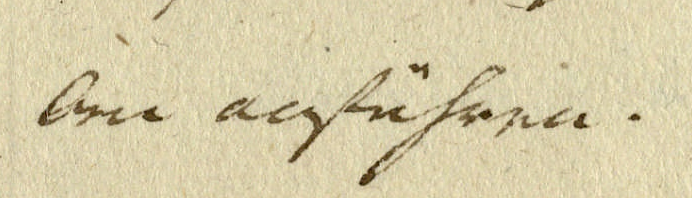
ben anführen.
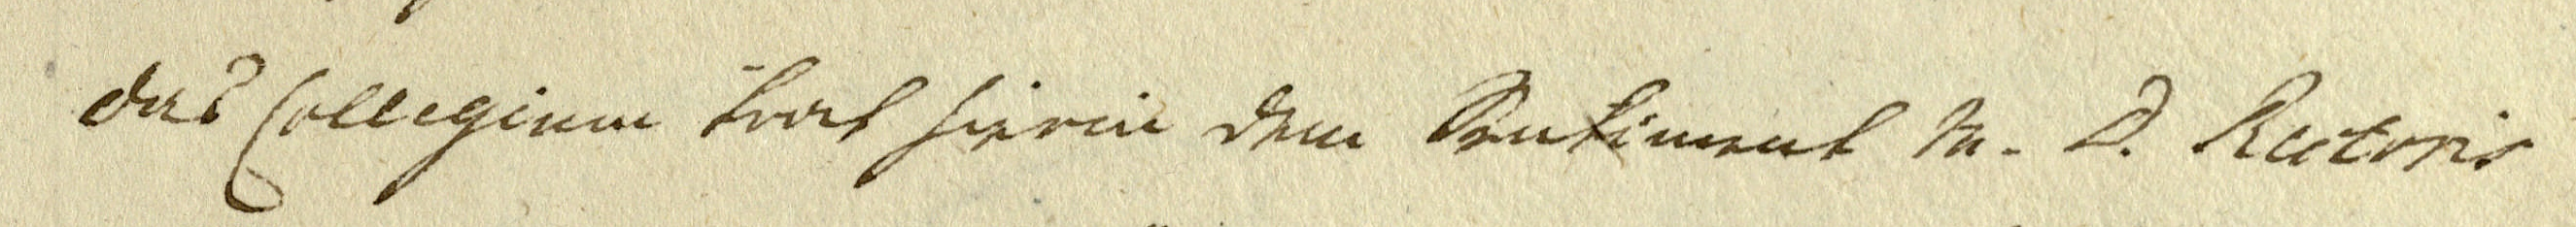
Das Collegium trat hierin dem Sentiment M. D. Rectoris
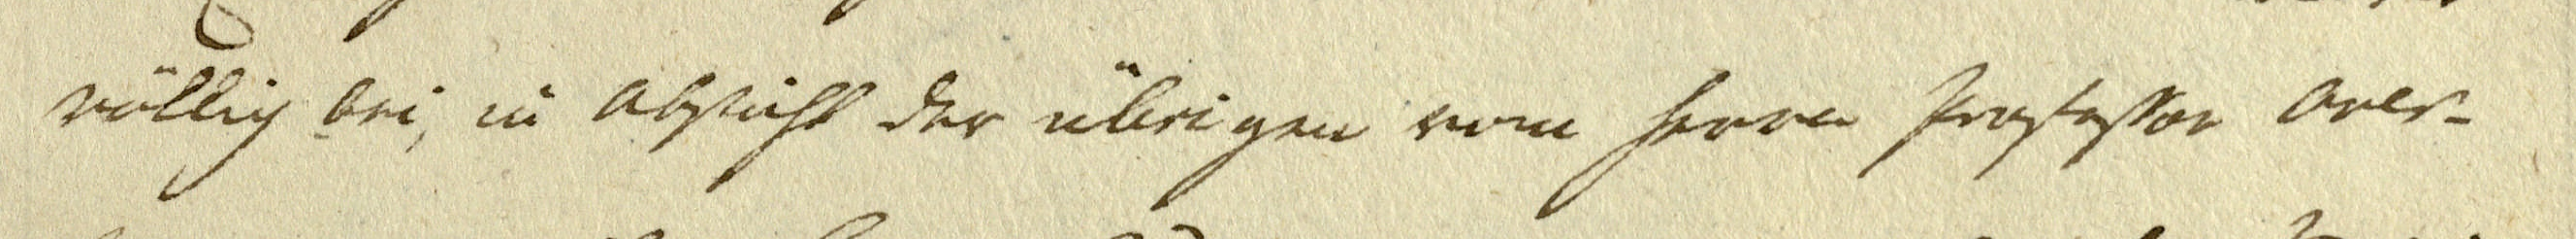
völlig bei, in Absicht der übrigen vom Herrn Professor Over¬
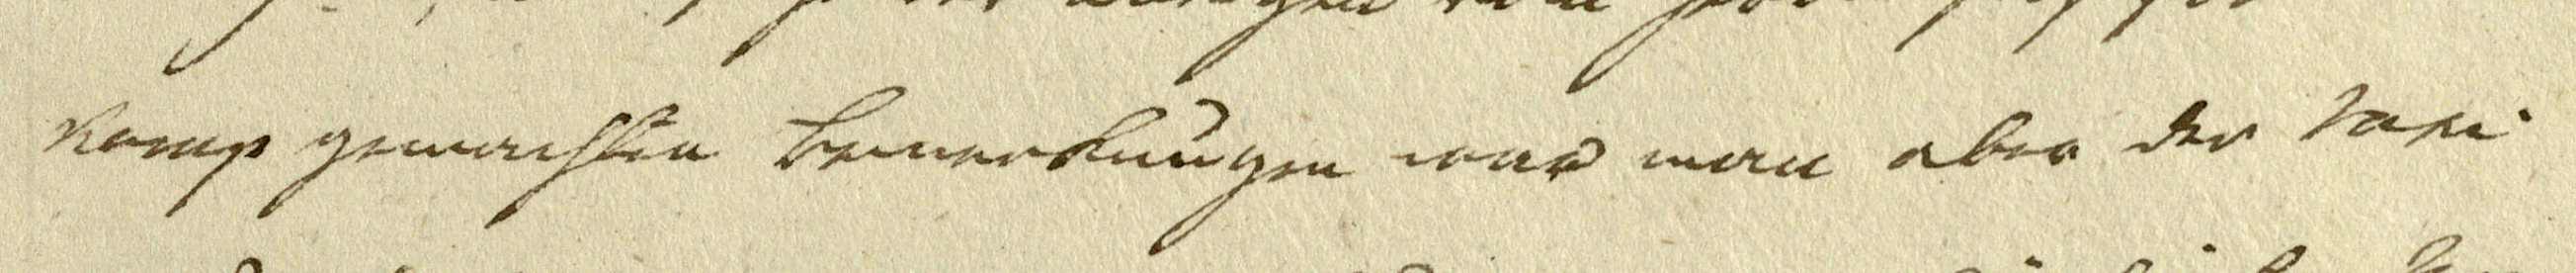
kamp gemachten Bemerkungen war man aber der Mei¬
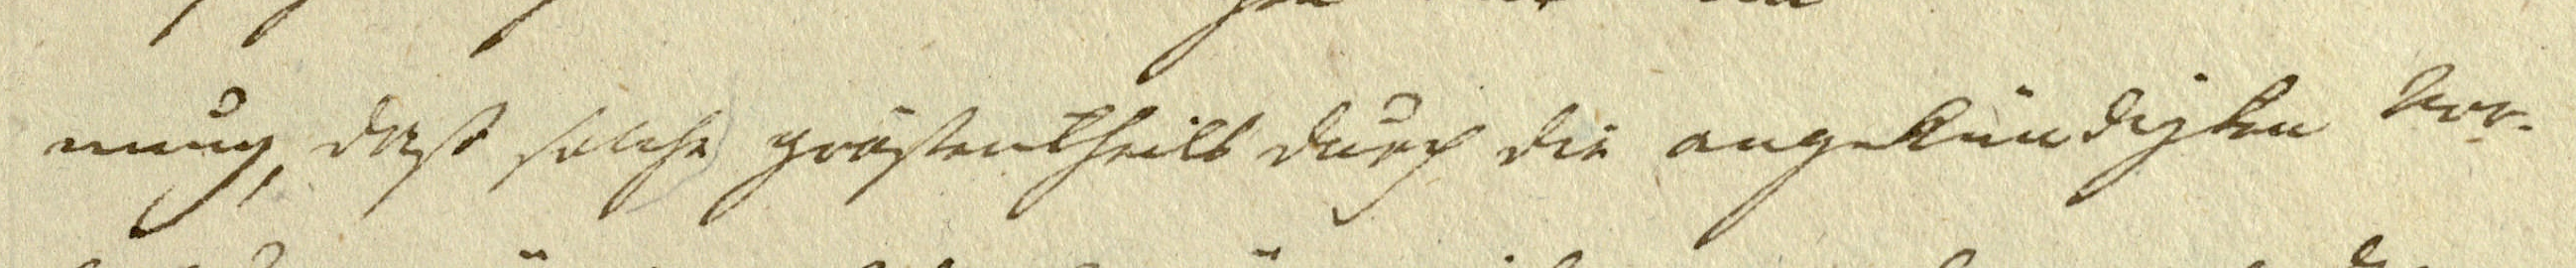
nung, daß solche gröstentheils durch die angekündigten Vor¬
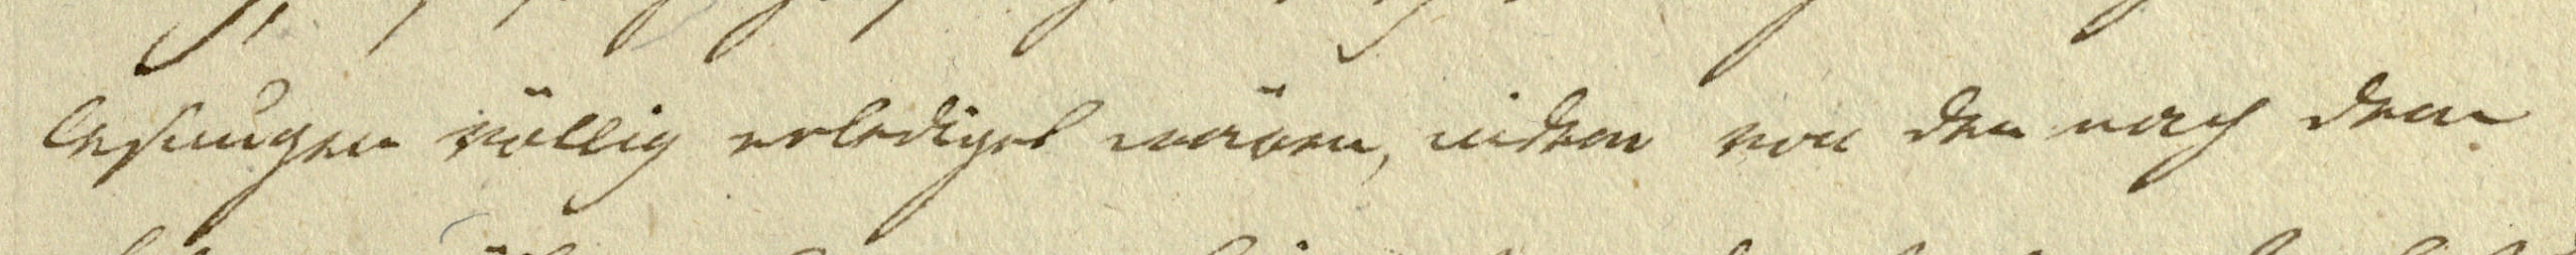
lesungen völlig erlediget wären, indem von den nach dem
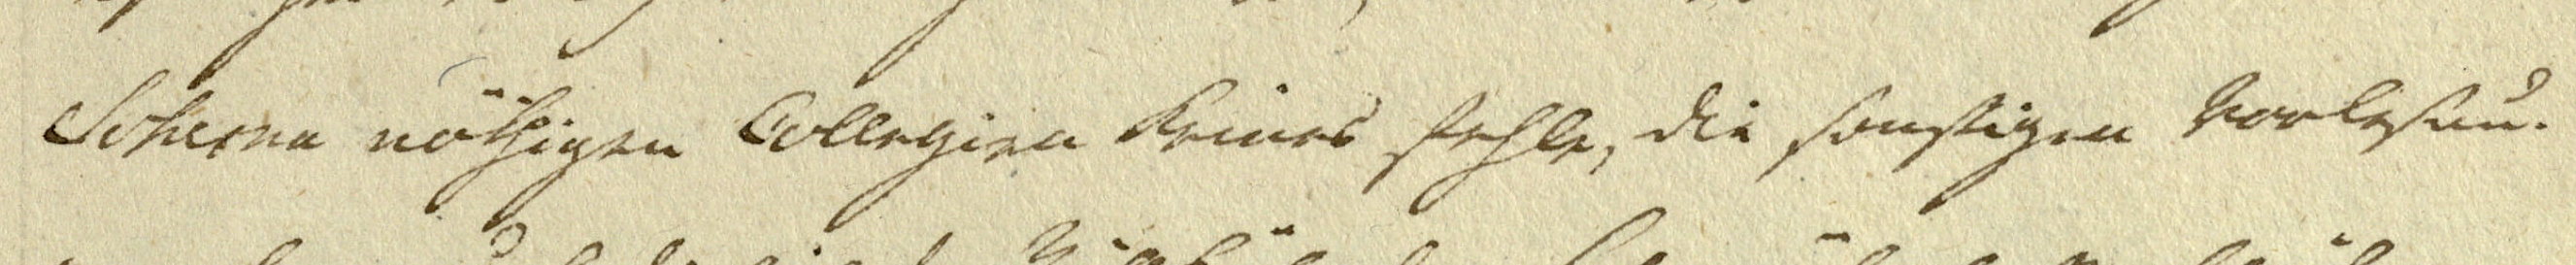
Schema nöthigen Collegien keines fehle, die sonstigen Vorlesun¬
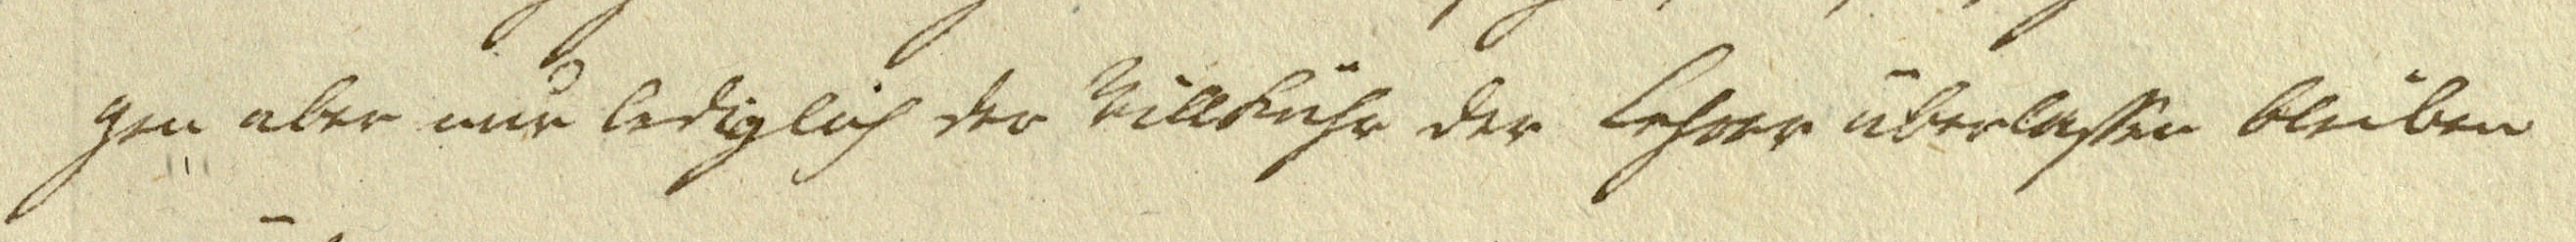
gen aber nur lediglich der Willkühr der Lehrer überlassen bleiben
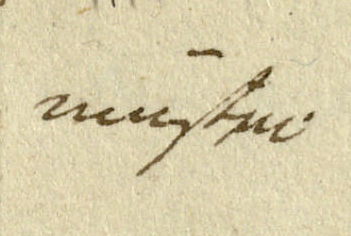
müsten.
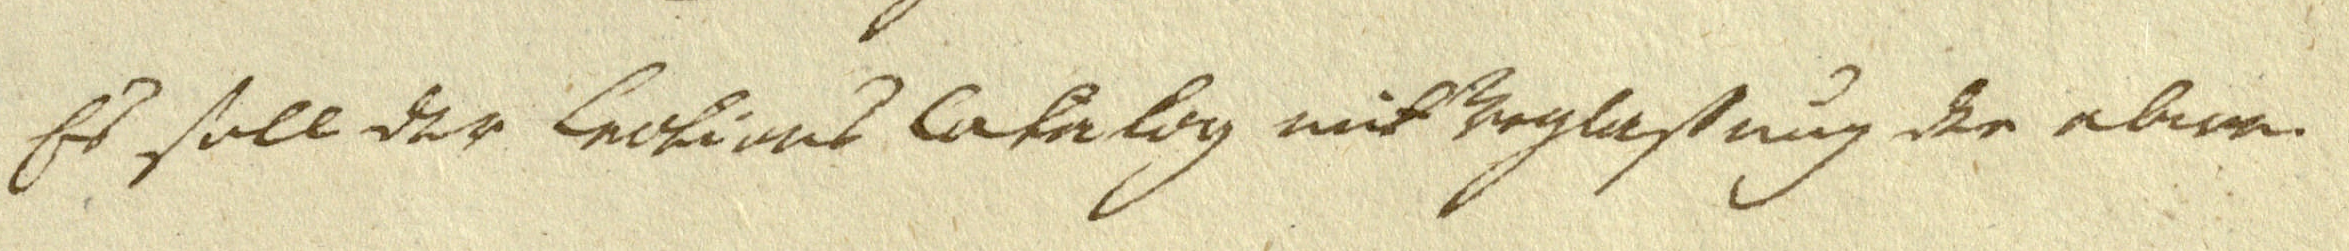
Es soll der Lections Catalog mit Weglassung der abwe¬
